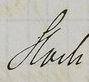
Herr
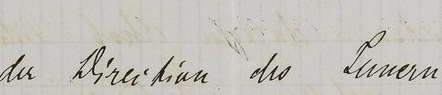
der Direction des Innern
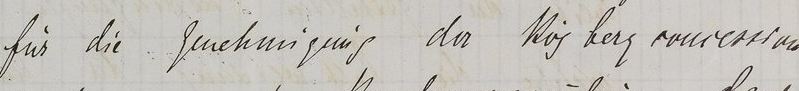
für die Genehmigung der Bözbergconcession
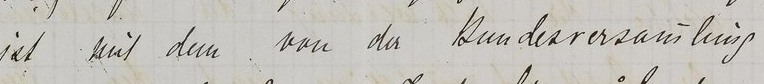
ist mit dem von der Bundesversammlung beschlos-
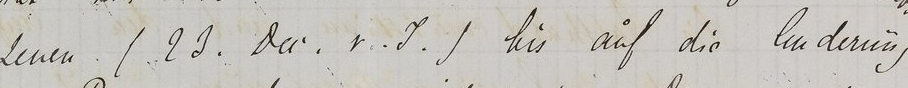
senen ( 23. Dec. v. J. ) bis auf die Änderung
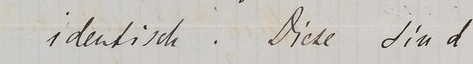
identisch. Diese sind
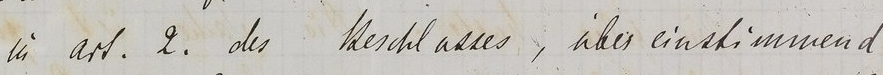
in Art. 2. des Beschlusses, übereinstimmend
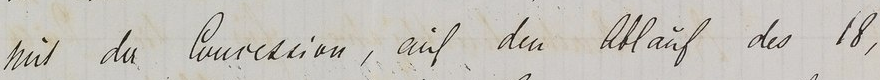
mit der Concession, auf den Ablauf des 18,
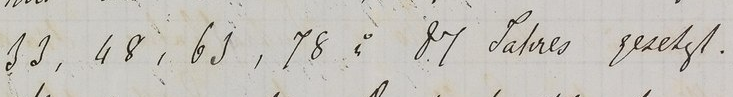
33, 48, 63, 78 u 87 Jahres gesetzt.
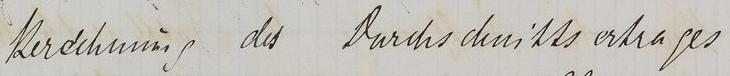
Berechnung des Durchschnittsertrages
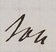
bean-
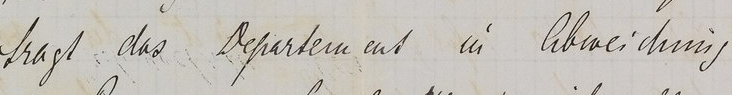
tragt das Departement in Abweichung
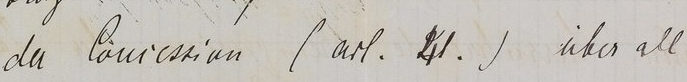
der Concession (Art. 41) überall
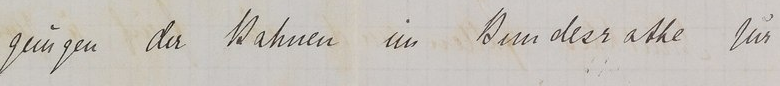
gungen der Bahnen im Bundesrathe zur
